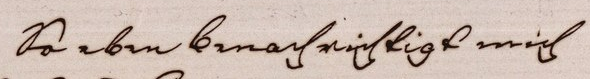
So eben benachrichtigt mich
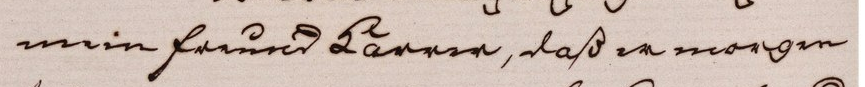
mein Freund Karrer, daß er morgen
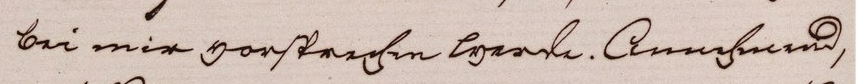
bei mir vorsprechen werde. Annehmend,
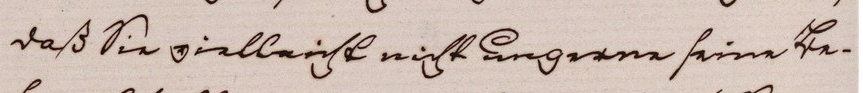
daß Sie vielleicht nicht ungerne seine Be-
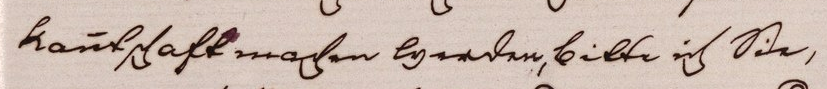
kanntschaft machen werden, bitte ich Sie,
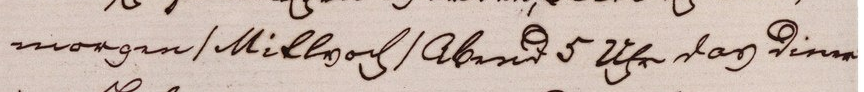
morgen (Mitwoch) Abend 5 Uhr das Diner
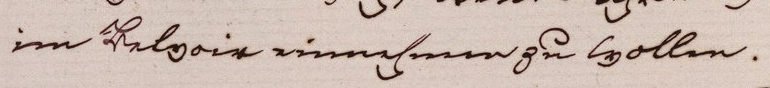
im Belvoir einnehmen zu wollen.
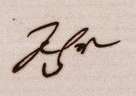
Escher
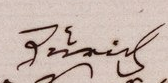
Zürich
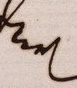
Septr
